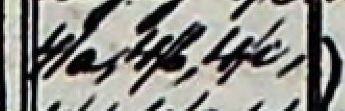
4/a, 4/b, 4/c
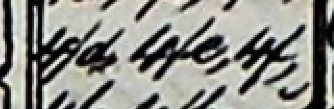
4/d, 4/e, 4f,
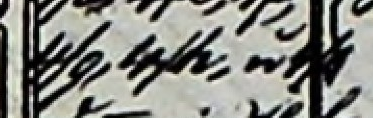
4/g, 4/h, u ???
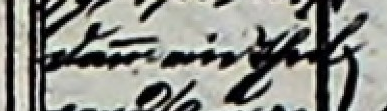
dann in Theil
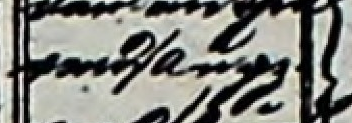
von 2/a u gg.
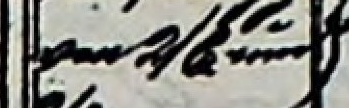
von 2/b um 2/c
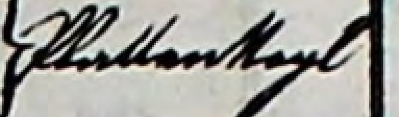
Plattenkogl
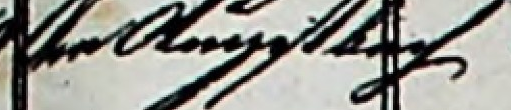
An Augstbach
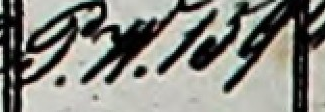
G.W.159
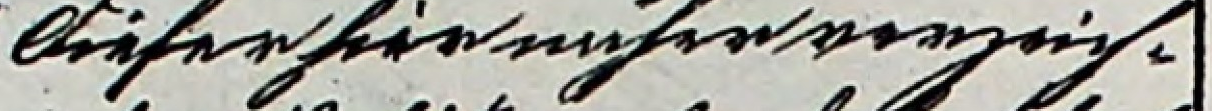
Dieser hier näher verzeich„
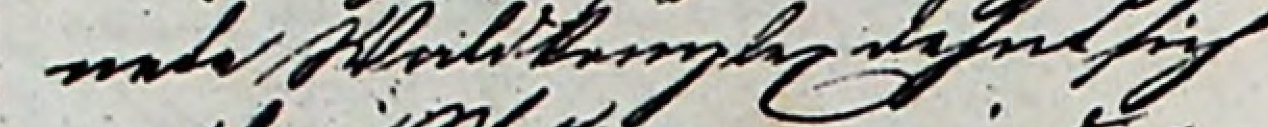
nete Waldkemple dehnt sich
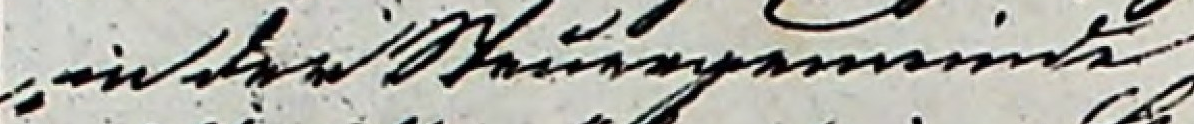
in der Steuergemeinde
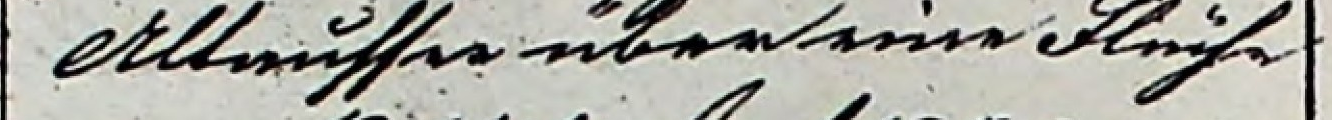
Altaussee über eine Fläche
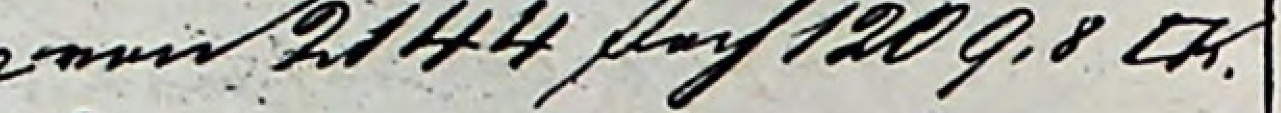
von 2144 stech 1209,8 Ck.
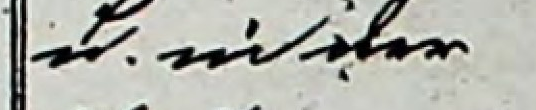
u. in der
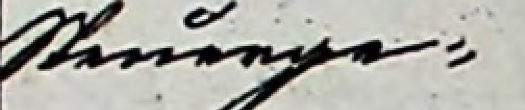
Steuerge=
